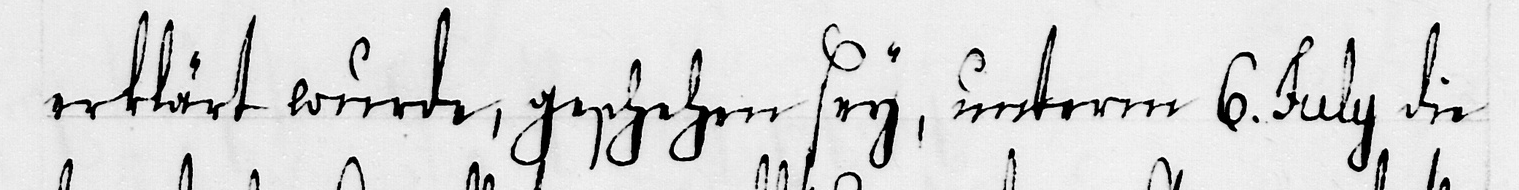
erklärt wurde, geschehen sey, unterm 6. July die
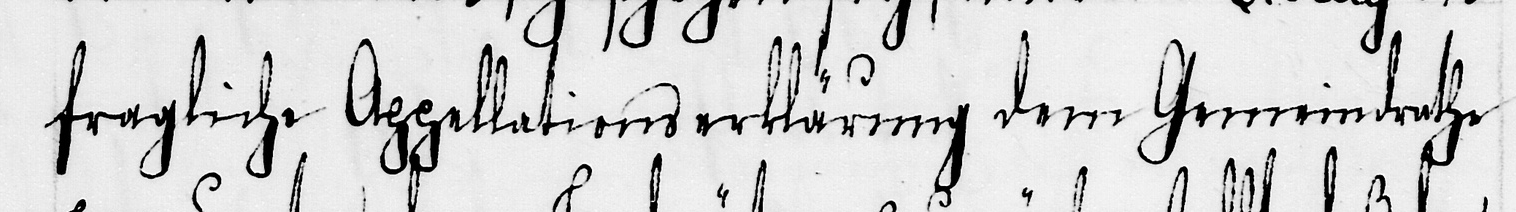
fragliche Appellationserklärung dem Gemeindrathe
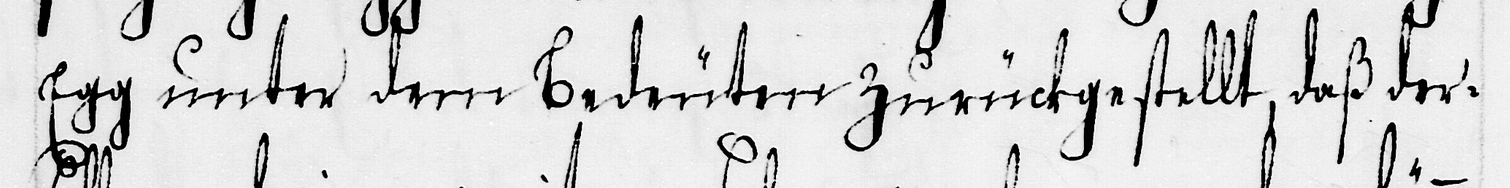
Egg unter dem Bedeuten zurückgestellt, daß der¬
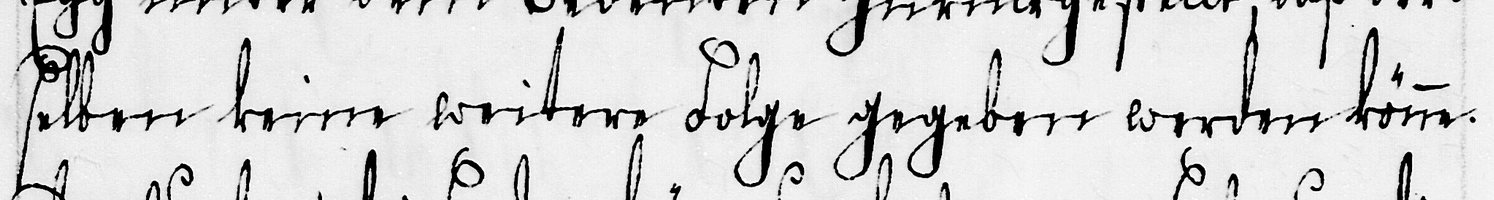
selben keine weitere Folge gegeben werden könn¬
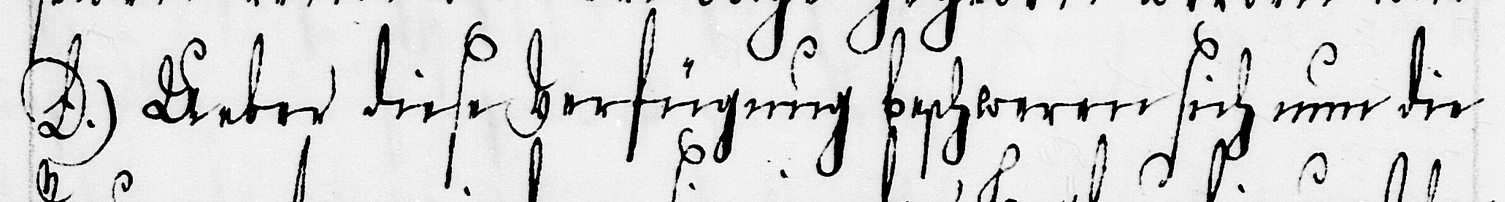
D.) Ueber diese Verfügung beschweren sich nun die
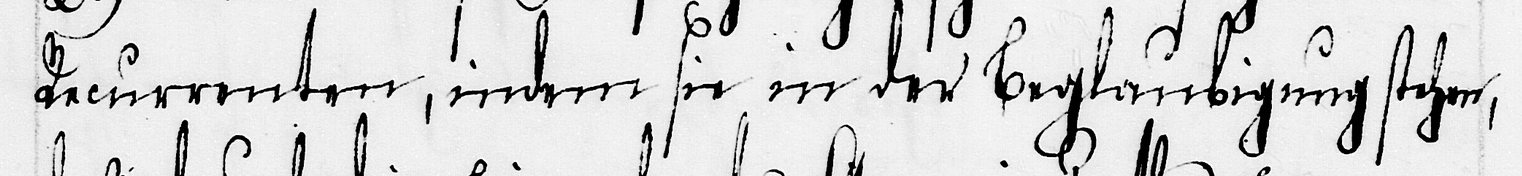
Recurrenten, indem sie in der Beglaubigung stehen,
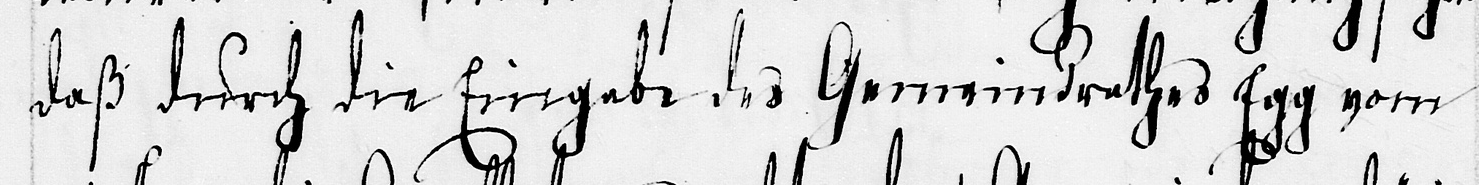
daß durch die Eingabe des Gemeindrathes Egg vom
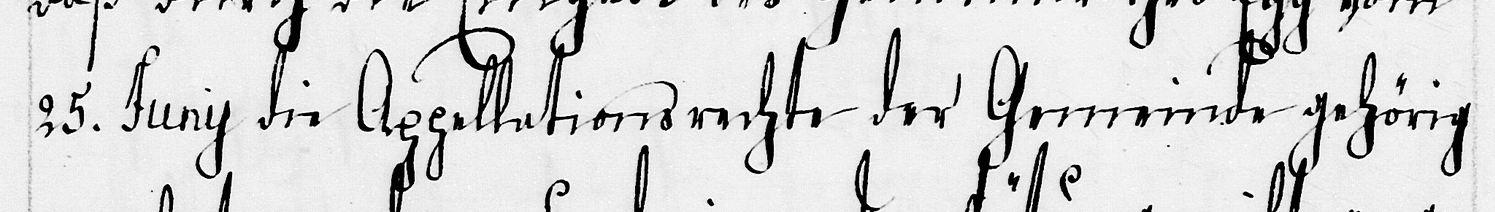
25. Juny die Appellationsrechte der Gemeinde gehörig
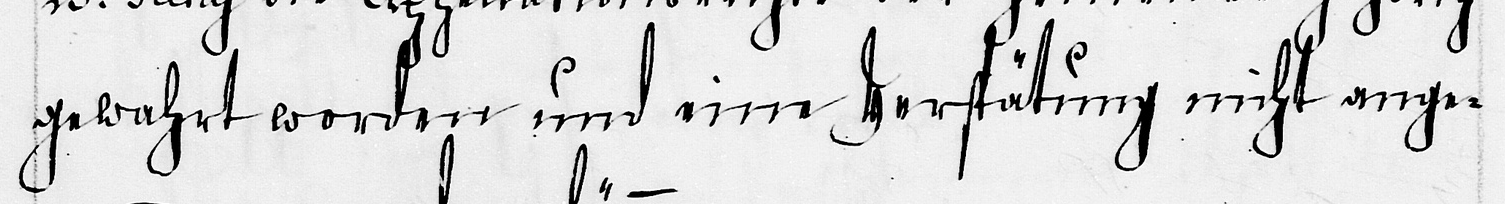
gewahrt worden und eine Verspätung nicht ange¬
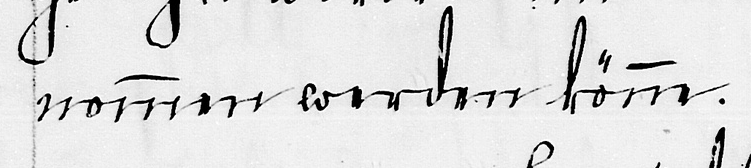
nommen werden könne.
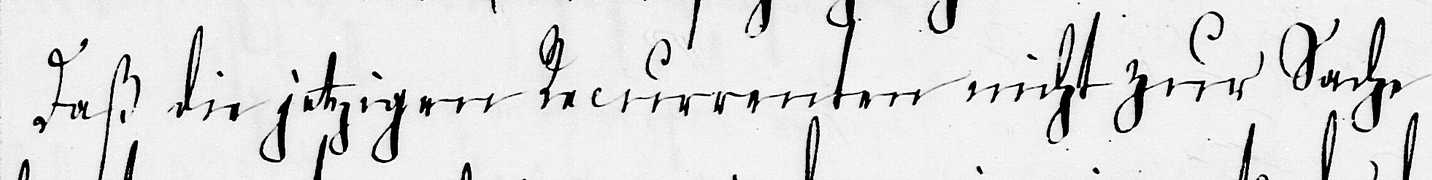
Daß die jetzigen Recurrenten nicht zur Sache
